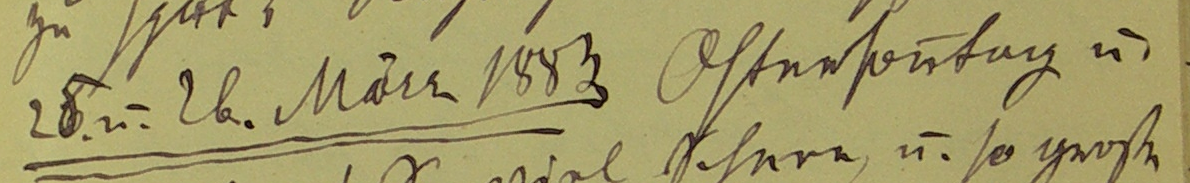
25. und 26. März 1883. Ostersonntag und
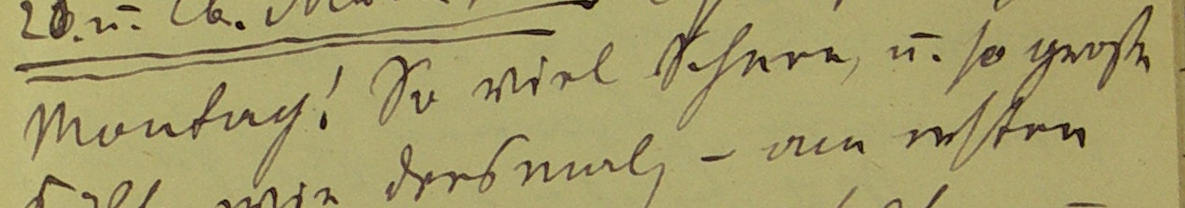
Montag !- So viel Schnee und so große
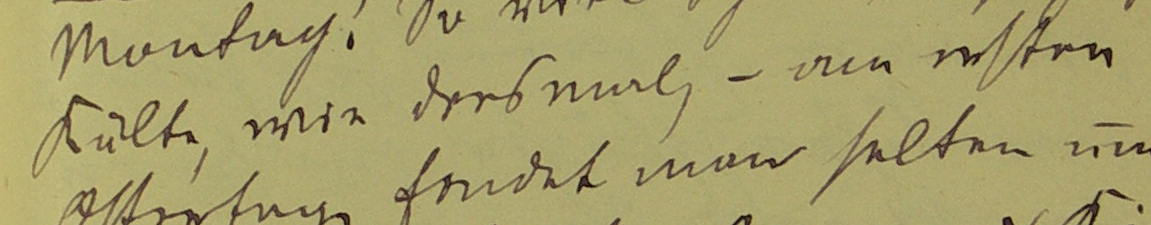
Kälte, wie diesmal- am ersten
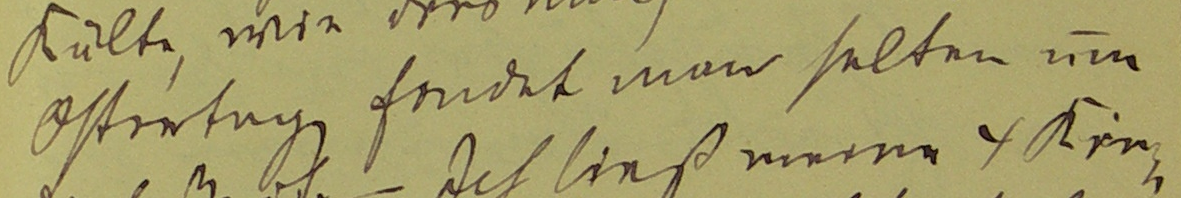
Ostertag findet man selten um
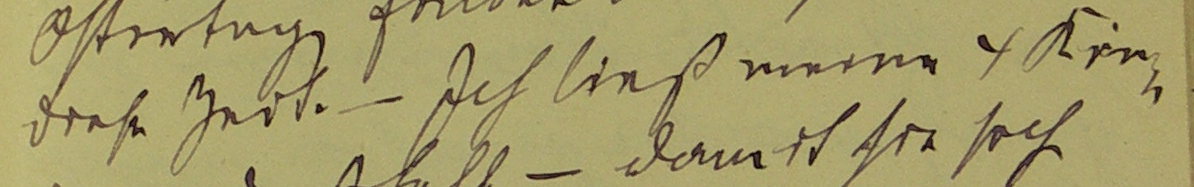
diese Zeit.- Ich ließ meine 4 Kin¬
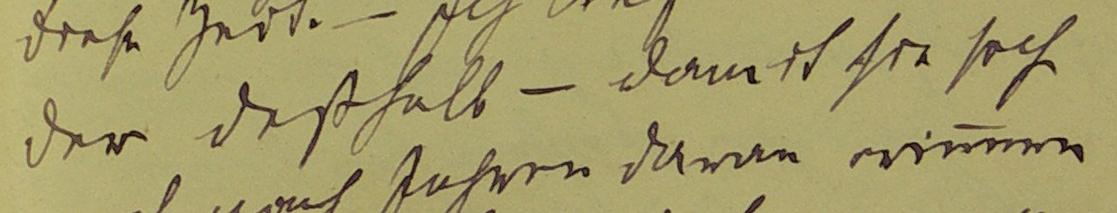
der deshalb- damit sie sich
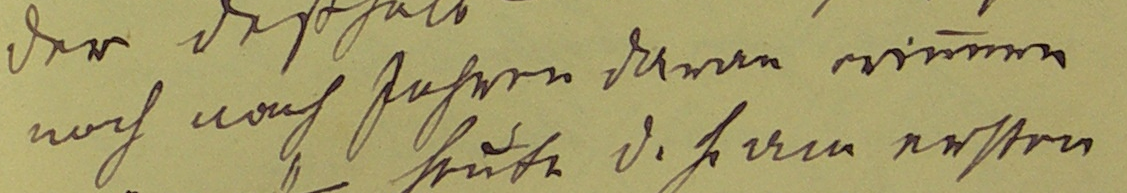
noch nach Jahren daran erinnern
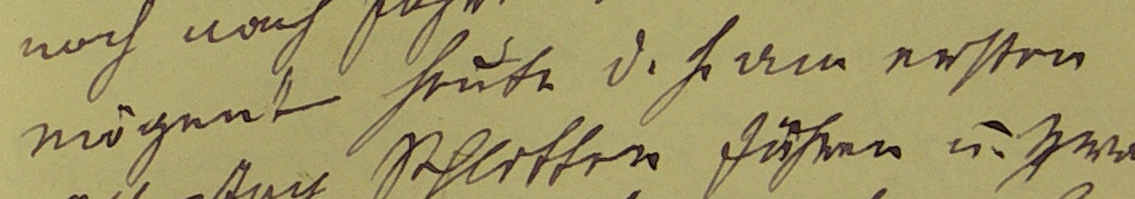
mögen—heute an diesem ersten
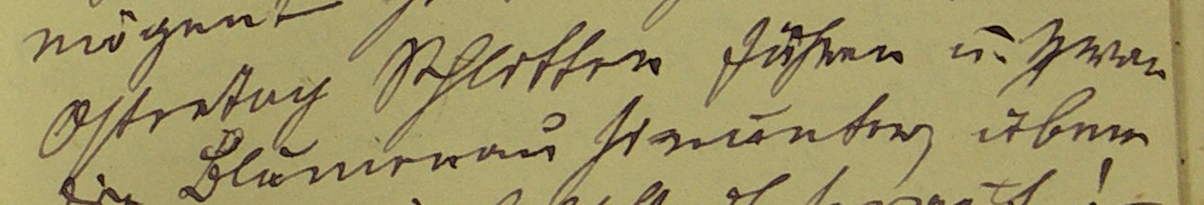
Ostertag Schlitten fahren und zwar
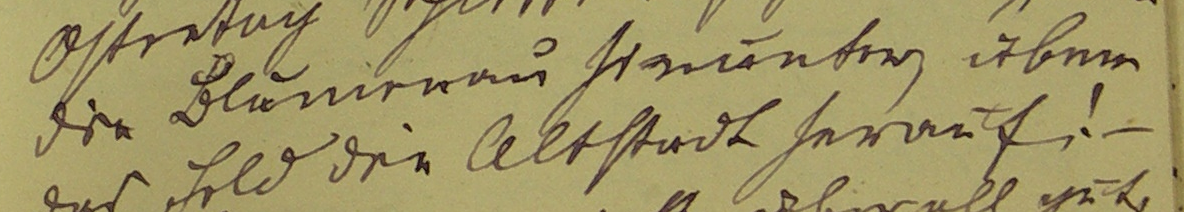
die Blumenau hinunter über
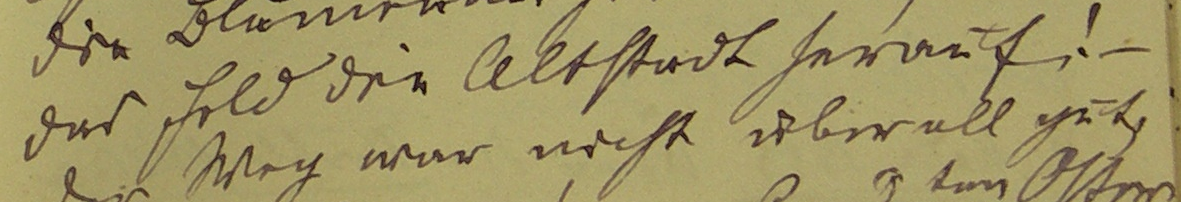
das Feld die Altstadt herauf!—
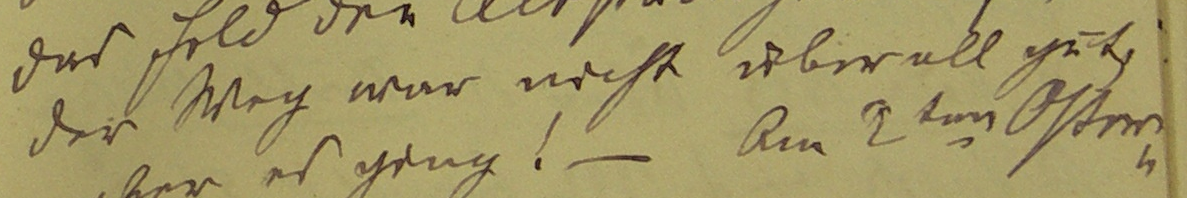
Der weg war nicht überall gut
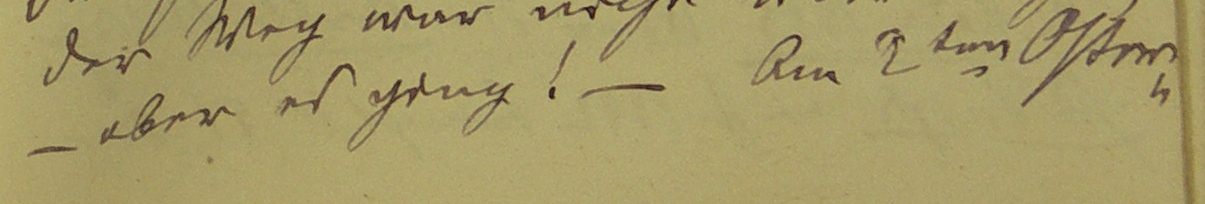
-aber es ging!—Am 2-ten Oster
